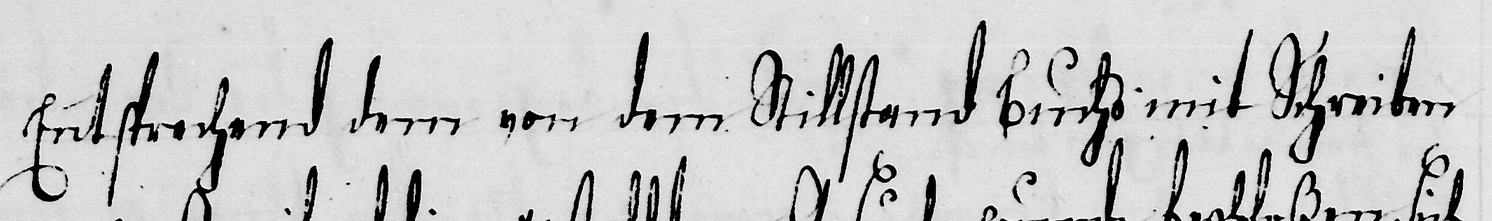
Entsprechend dem von dem Stillstand Buchs mit Schreiben
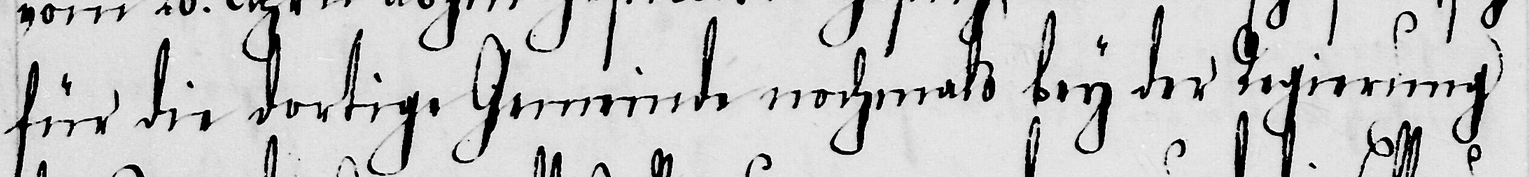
für die dortige Gemeinde nochmals bey der Regierung
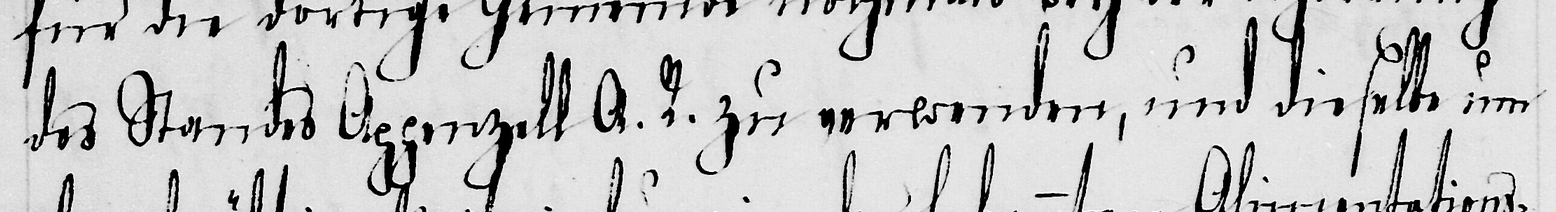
des Standes Appenzell A. R. zu verwenden, und dieselbe um
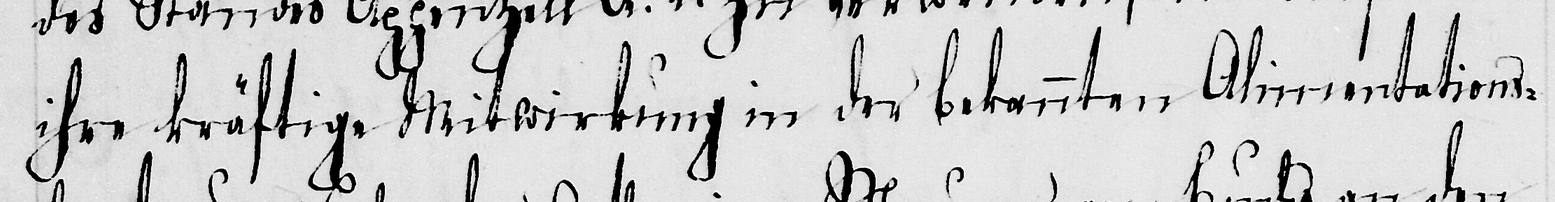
ihre kräftige Mitwirkung in der bekannten Alimentations¬
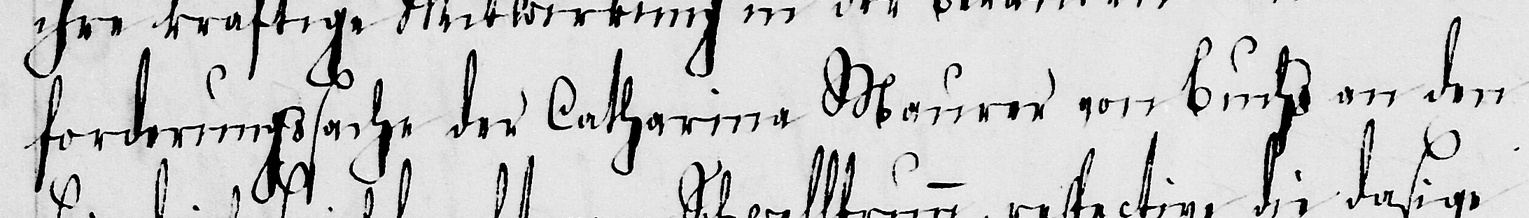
forderungssache der Catharina Maurer von Buchs an den
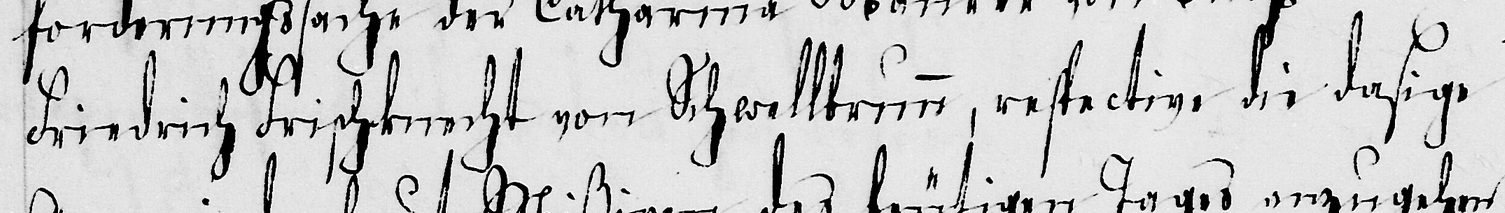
Friedrich Frischknecht von Schwellbrunn, respective die dasige
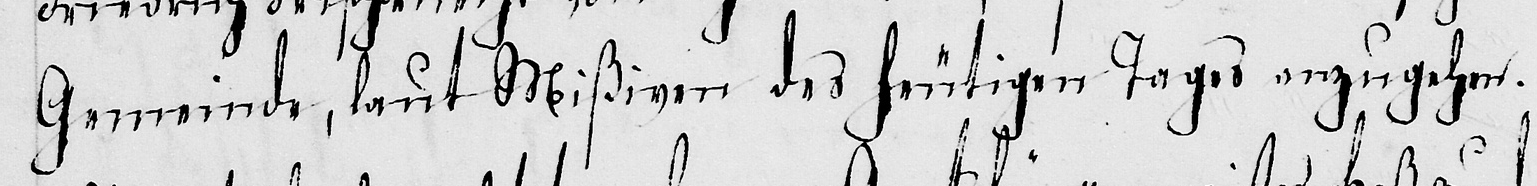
Gemeinde, laut Mißiven des heutigen Tages anzugehen.
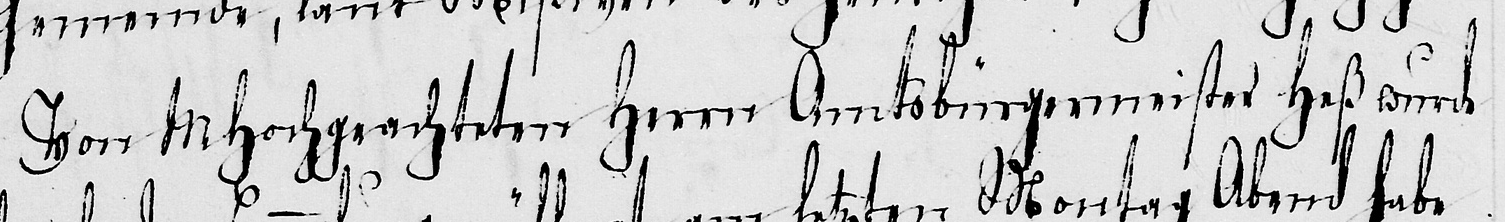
Von MHochgeachteten Herrn Amtsbürgermeister Heß wurde
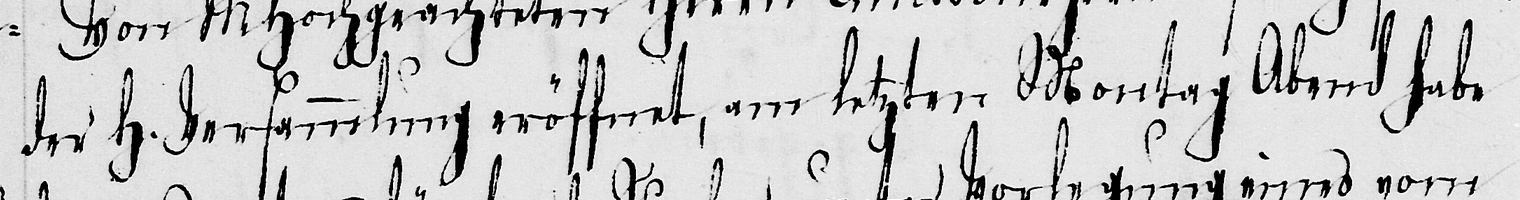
der H. Versammlung eröffnet, am letzten Montag Abend habe
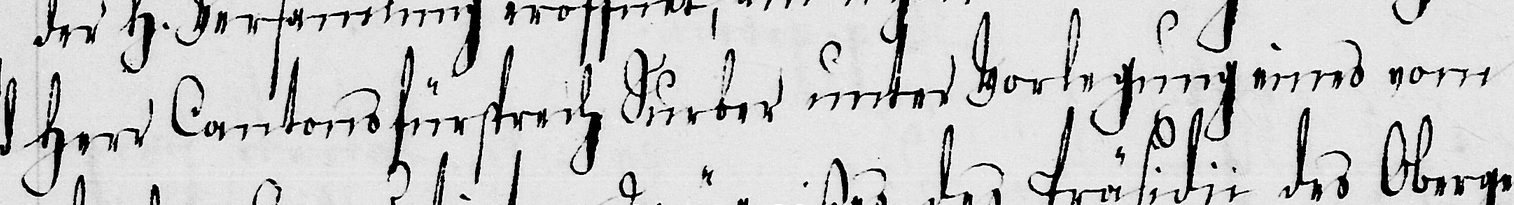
Herr Cantonsfürsprech Surber unter Vorlegung eines vom
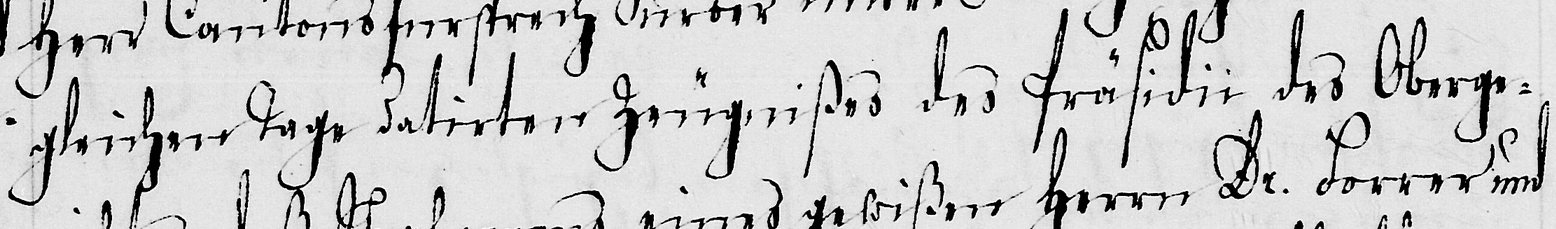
gleichen Tage datirten Zeugnißes des Präsidii des Oberge¬
